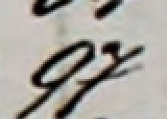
97
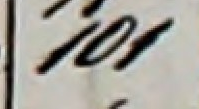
101
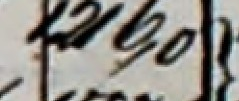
1216,0
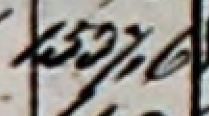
1537,6
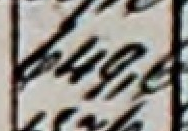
649,6
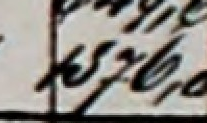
1376,0
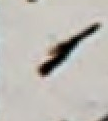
1
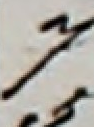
7
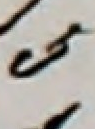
5
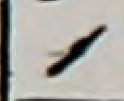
1
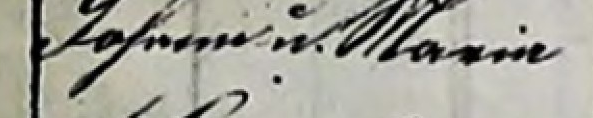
Johann u. Maria
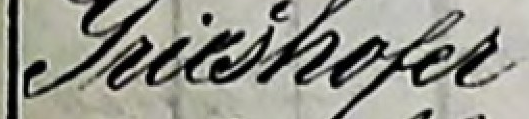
Grieshofer
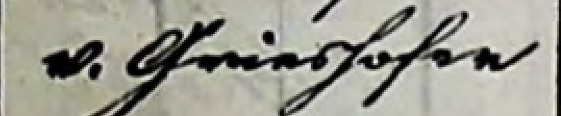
v. Grieshofer
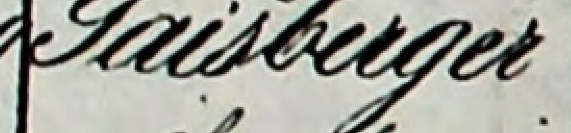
Franz u. Anna
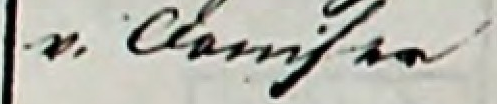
Gaisberger v. Deniser
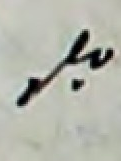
Do
